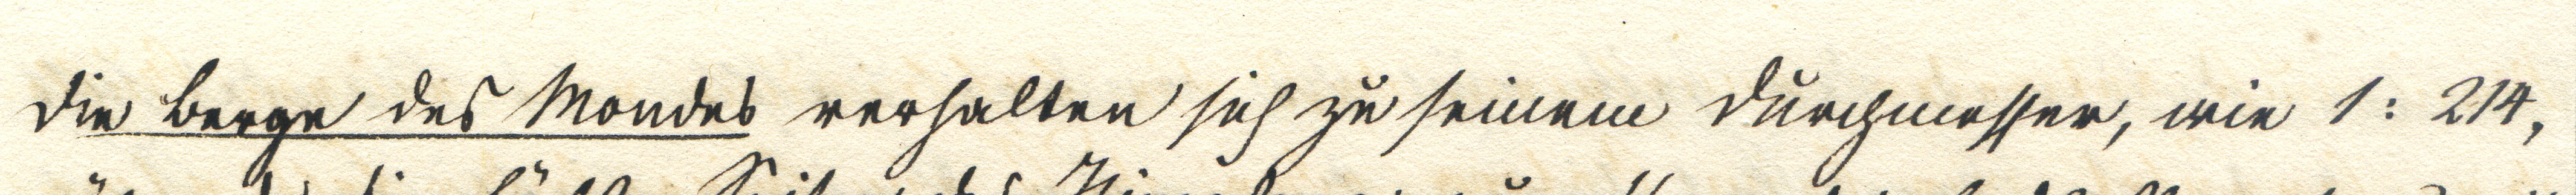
Die Berge des Mondes verhalten sich zu seinem Durchmesser, wie 1: 214,
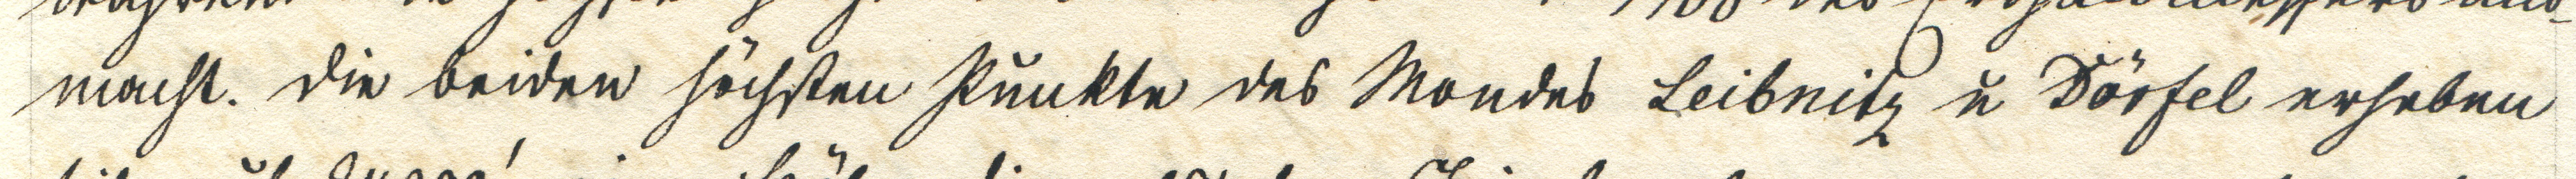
macht. Die beiden höchsten Punkte des Mondes Leibnitz u Dörfel erheben
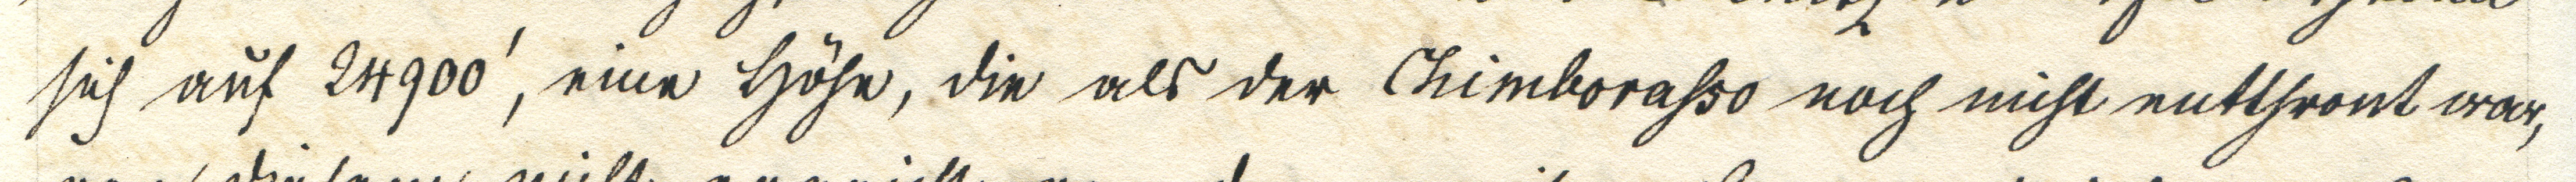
sich auf 24900′, eine Höhe, die als der Chimborasso noch nicht entthront war,
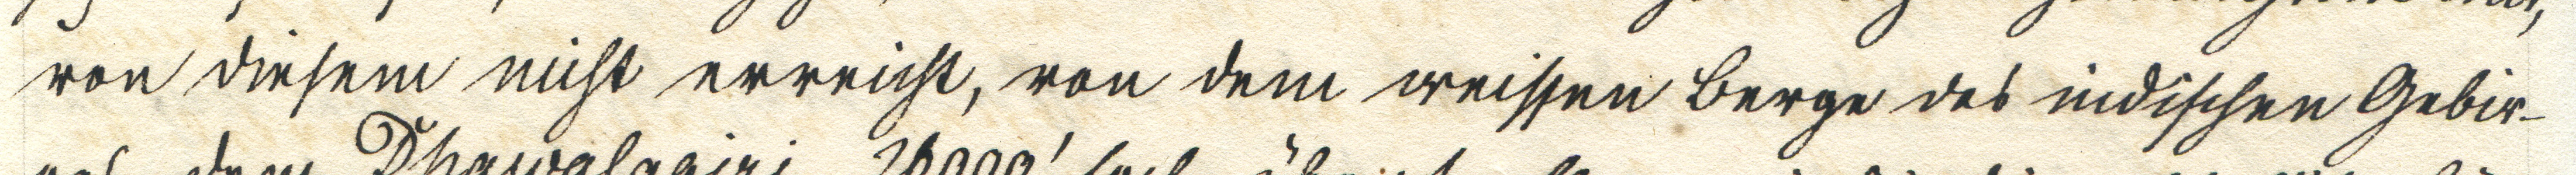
von diesem nicht erreicht, von dem weissen Berge des indischen Gebir-
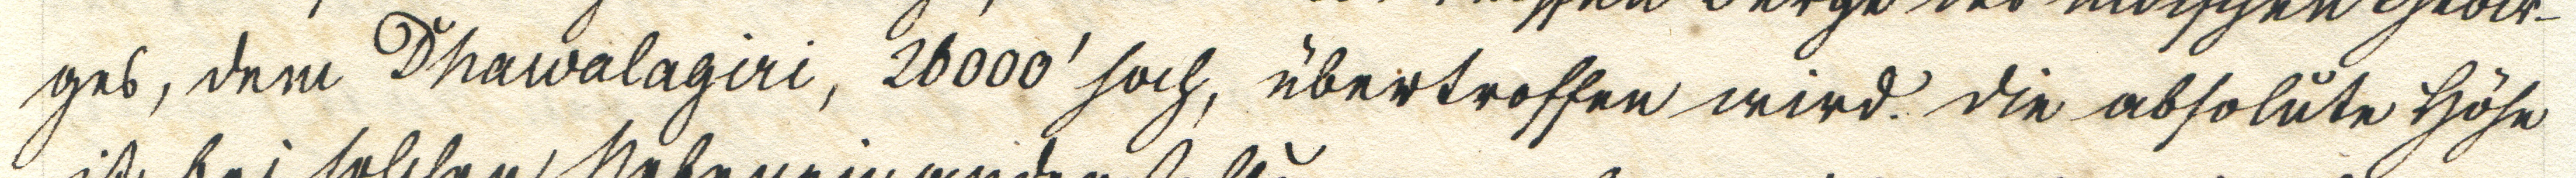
ges, dem Dhawalagiri, 26000′ hoch, übertroffen wird. Die absolute Höhe
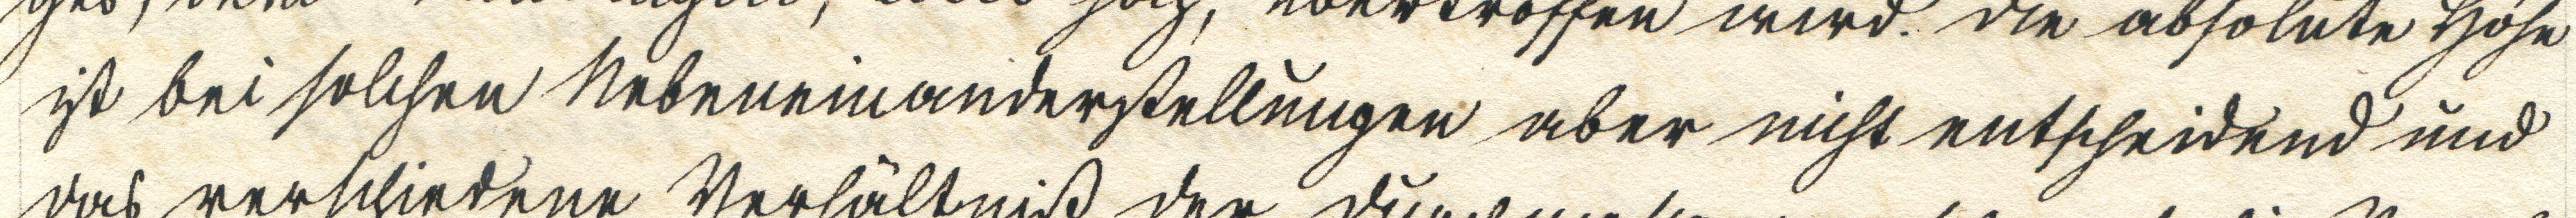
ist bei solchen Nebeneinanderstellungen aber nicht entscheidend und
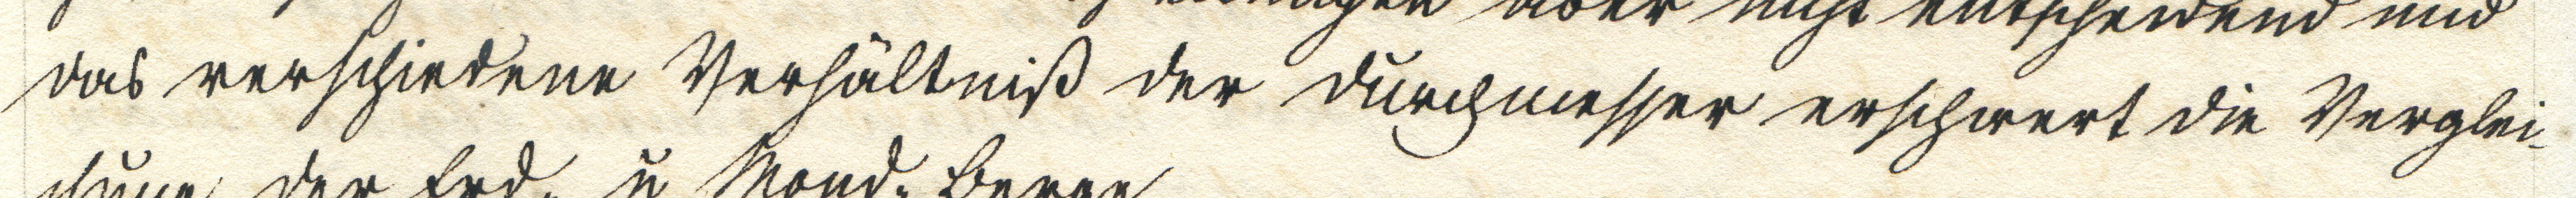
das verschiedene Verhältniß der Durchmesser erschwert die Verglei-
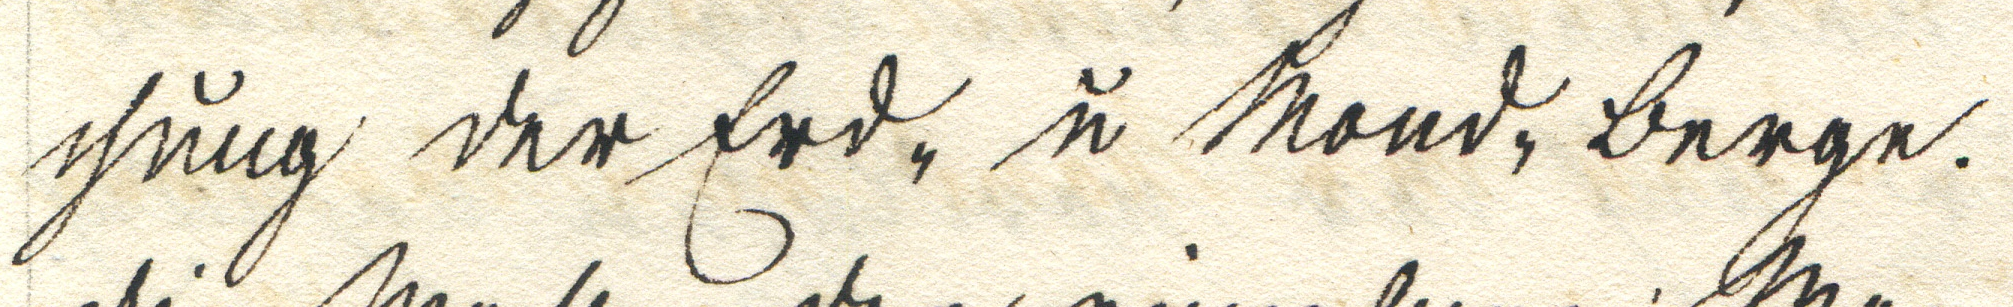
chung der Erd- u Mond-Berge.
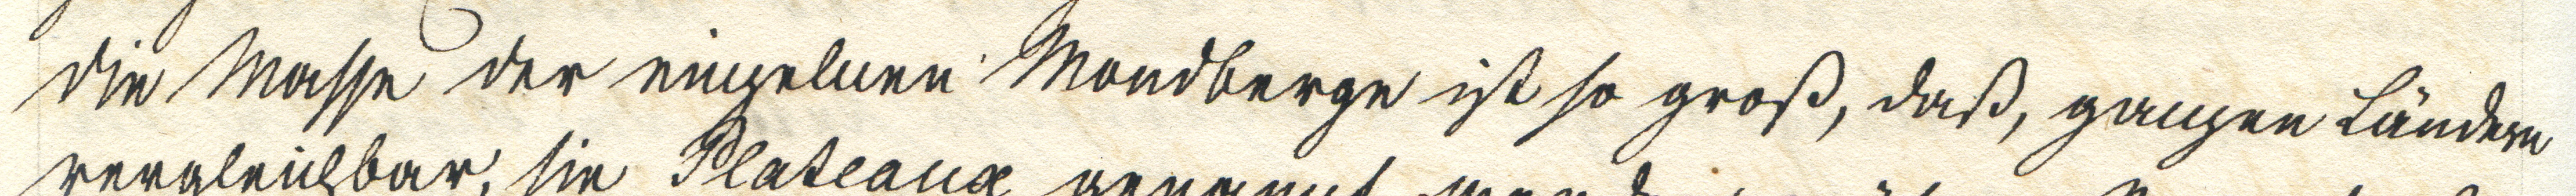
Die Masse der einzelnen Mondberge ist so groß, daß, ganzen Ländern
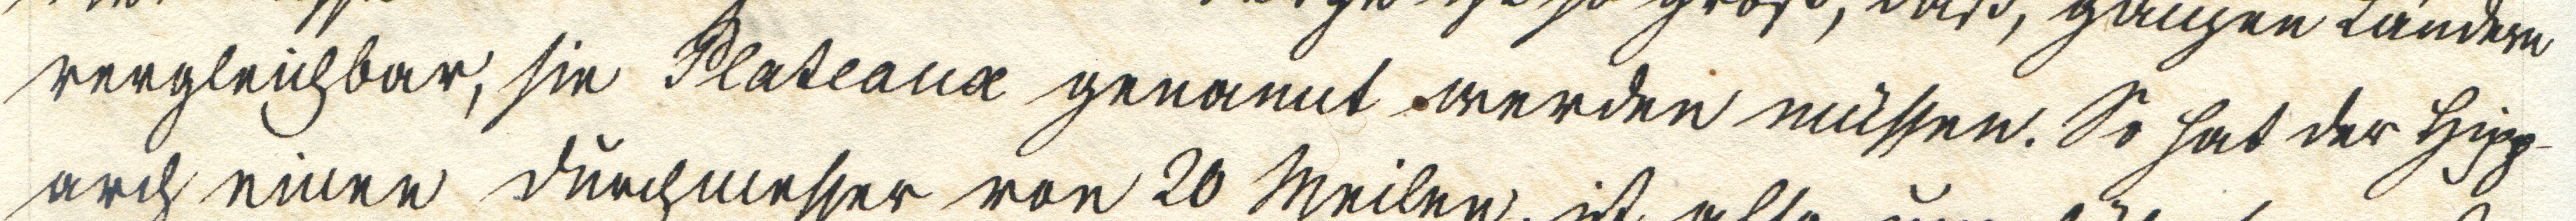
vergleichbar, sie Plateaux genannt werden müssen. So hat der Hipp-
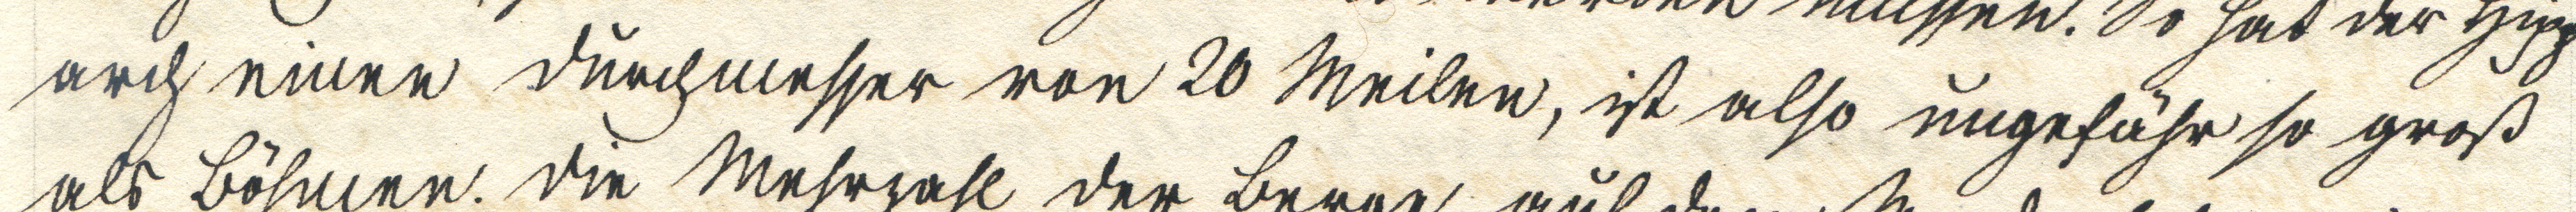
arch einen Durchmesser von 20 Meilen, ist also ungefähr so groß
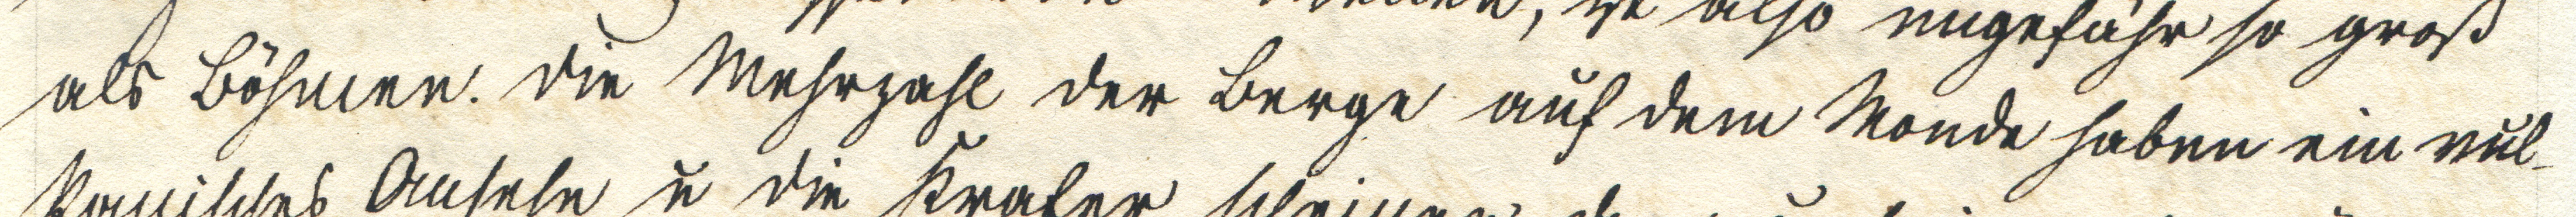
als Böhmen. Die Mehrzahl der Berge auf dem Monde haben ein vul-
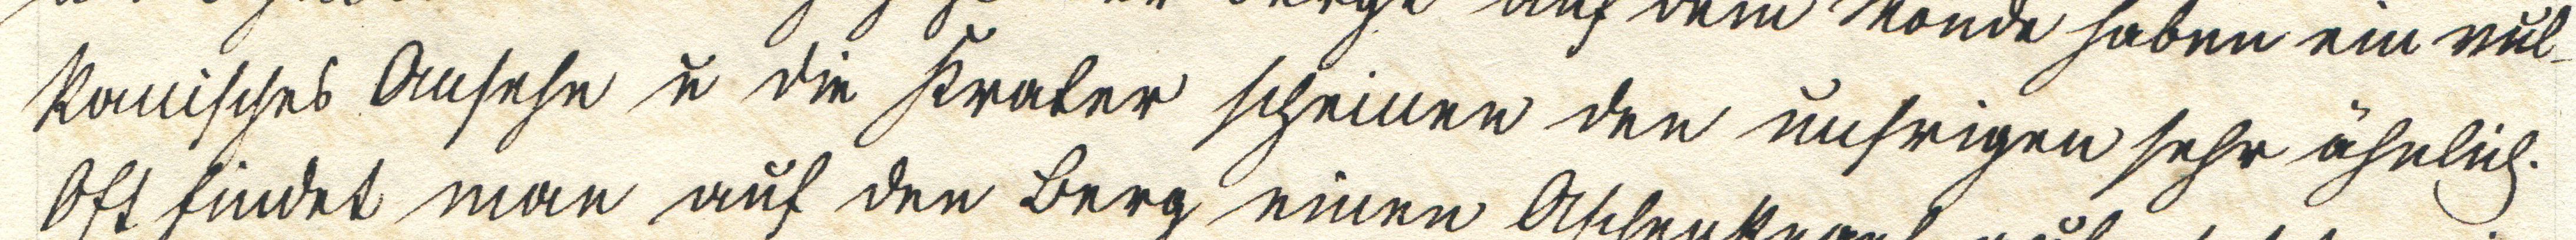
kanisches Ansehen u die Krater scheinen den unsrigen sehr ähnlich.
